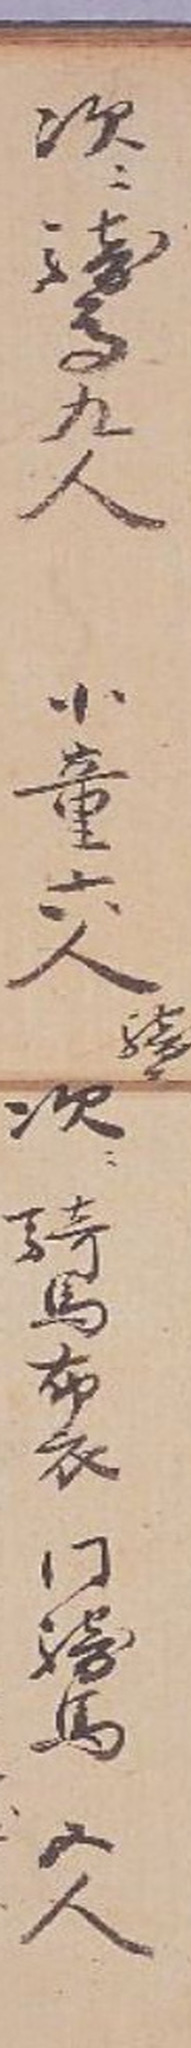次に騎馬九人小童六人次に騎馬布衣同騎馬五人
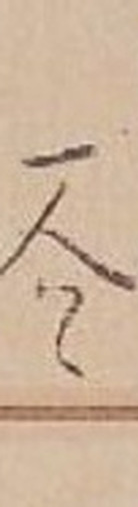一人ツゝ

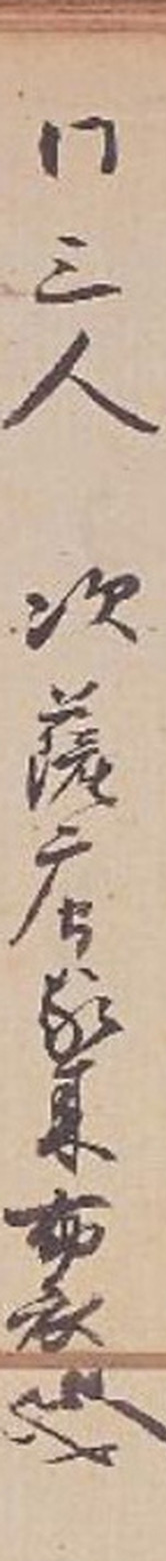同三人次薩摩守家来布衣

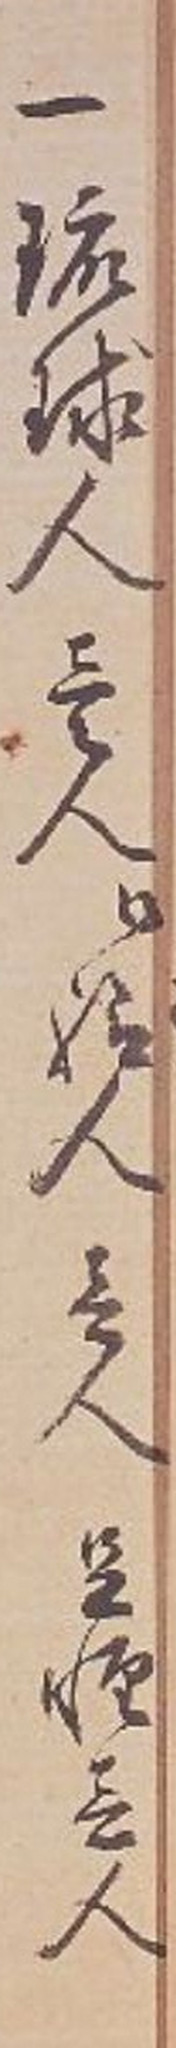一琉球人壱人え給人壱人足軽壱人
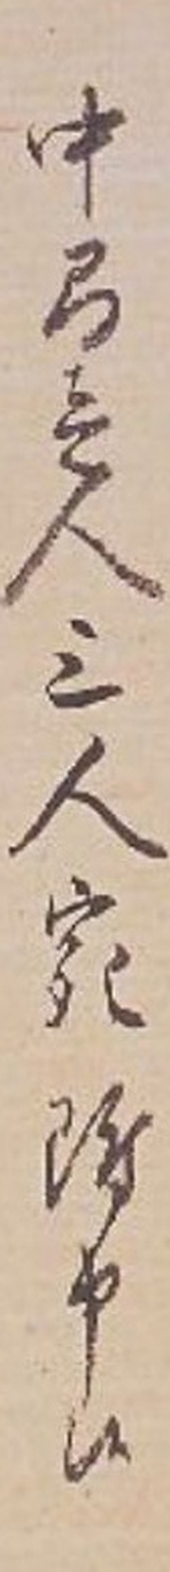中間壱人三人宛附申候
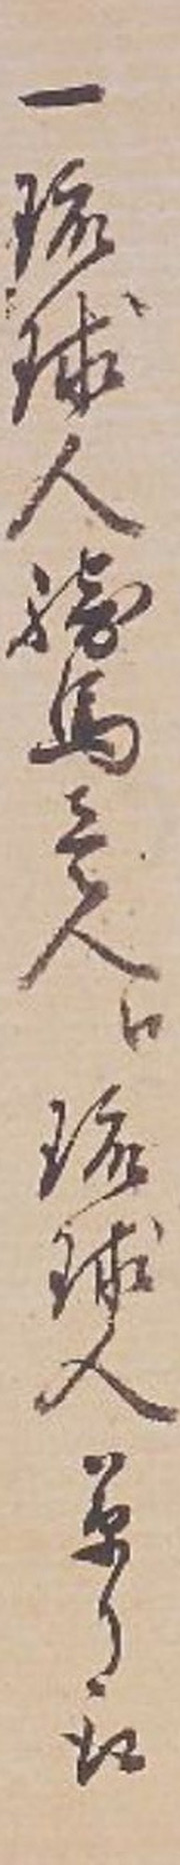一琉球人騎馬壱人え琉球人草り取
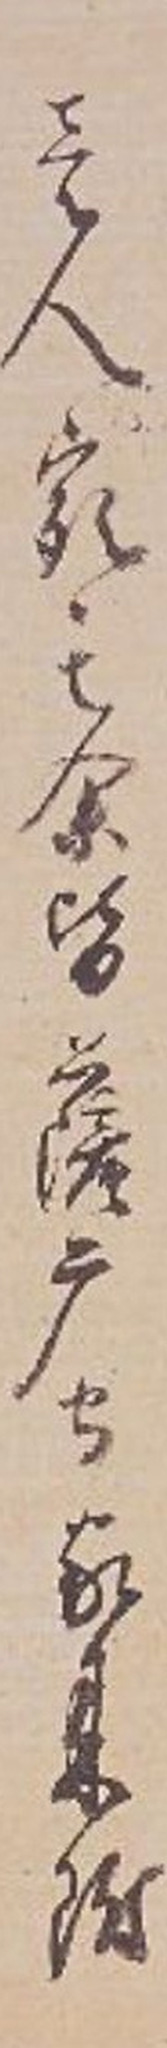壱人宛其余皆薩摩守家来附

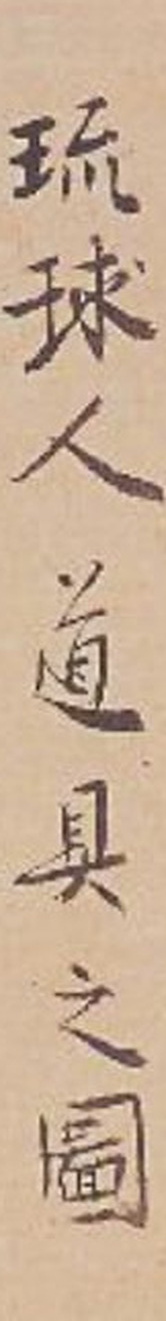琉球人道具之図

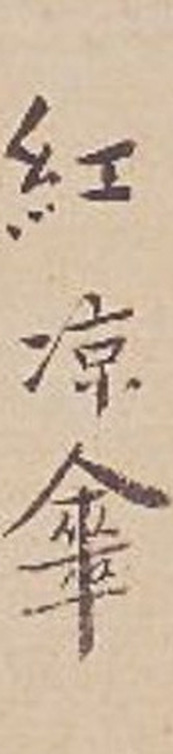紅涼傘

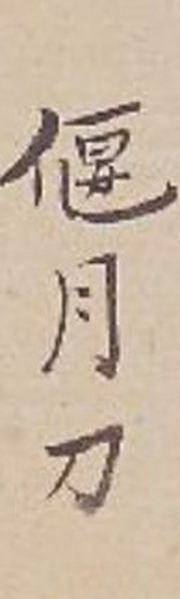偃月刀

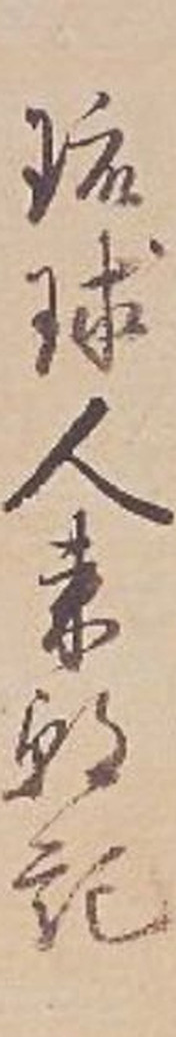琉球人来朝記
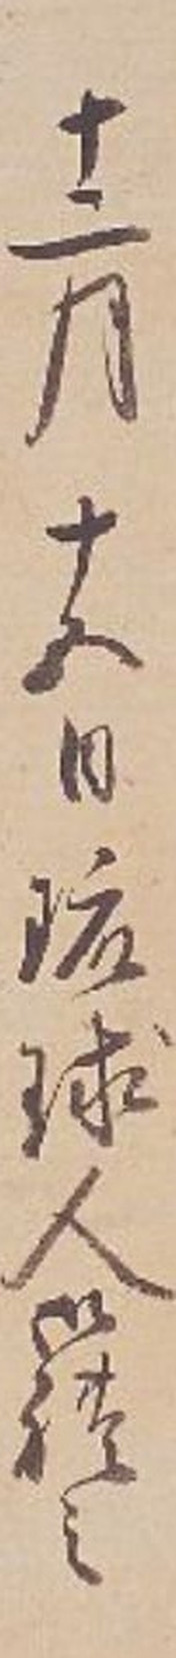十二月十五日琉球人御礼之
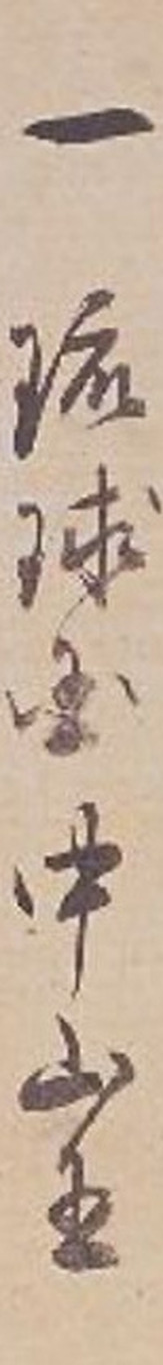一琉球国中山王
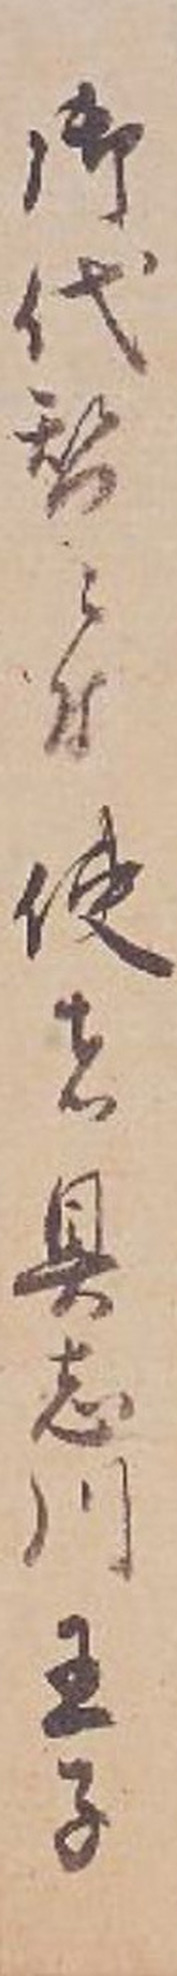御代替に付使者具志川王子
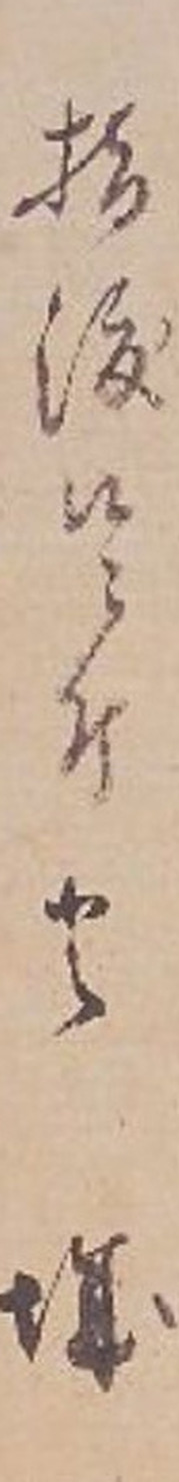指渡候に付登城
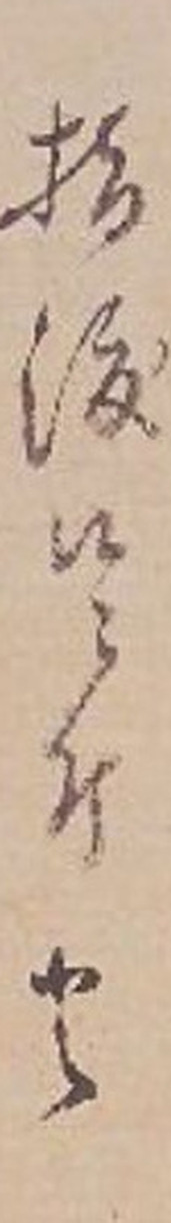指渡候に付登城
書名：琉球人来朝記 三、四
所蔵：University of the Ryukyus Library
